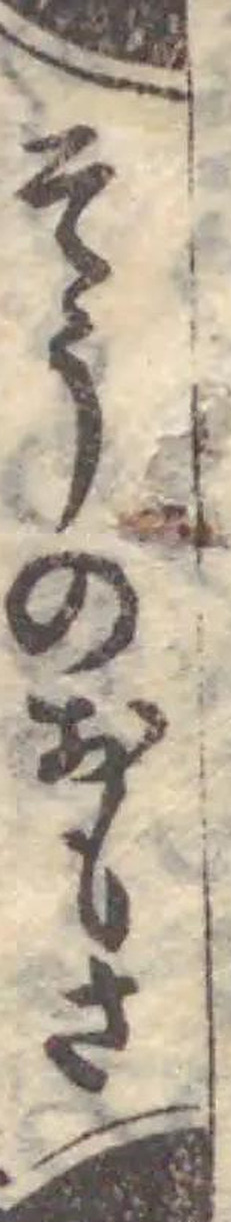『そうのおもさ
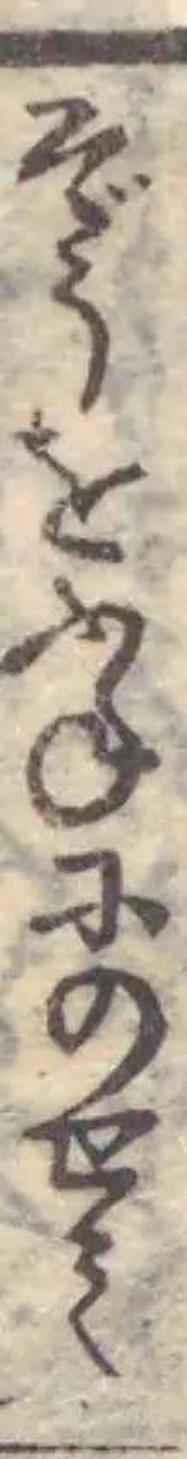ぞうをふねにのせて
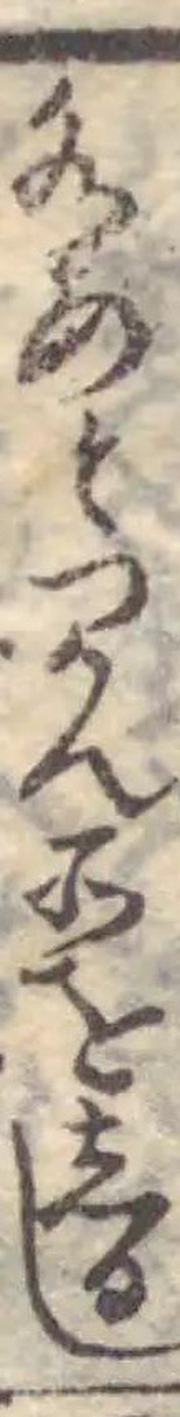水あとつかん所をしるし
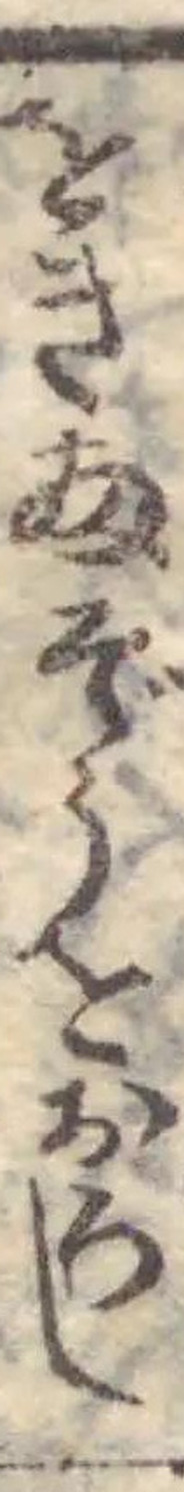おき扨ぞうをおろし
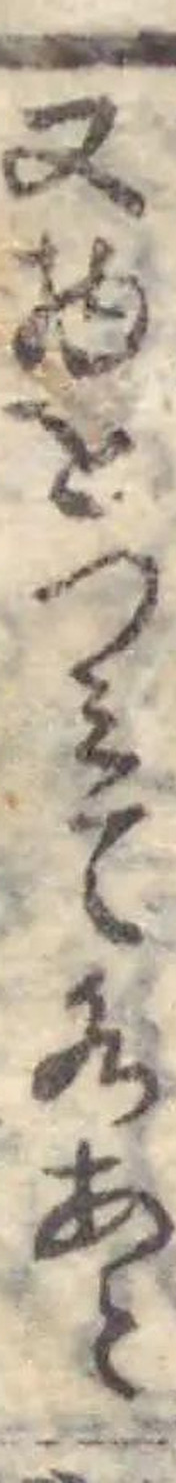又物をつみて水あと
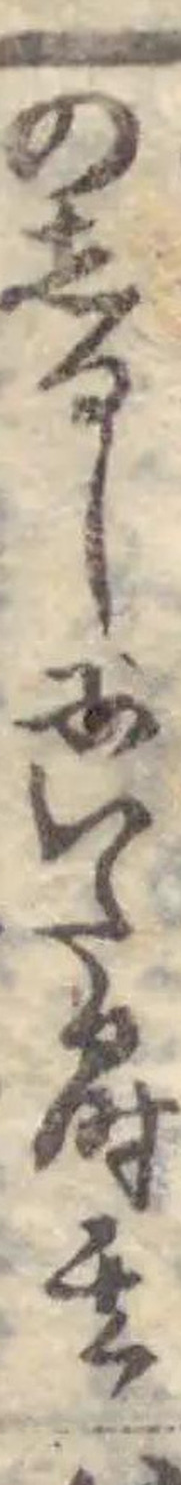のしるしにいたる時其
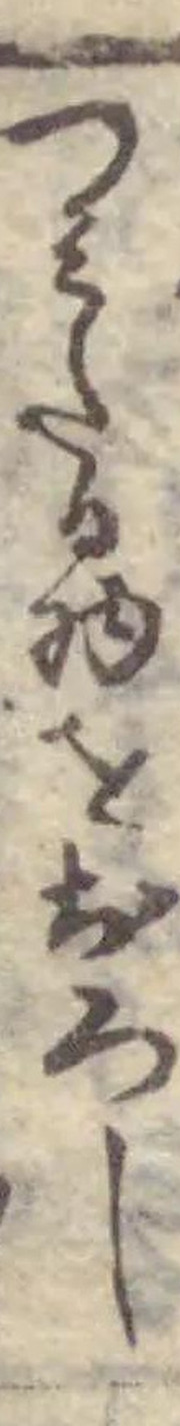つみたる物をおろし
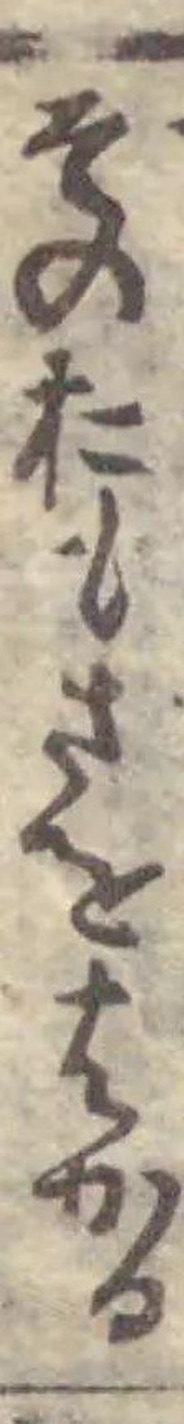そのおもさをはかる
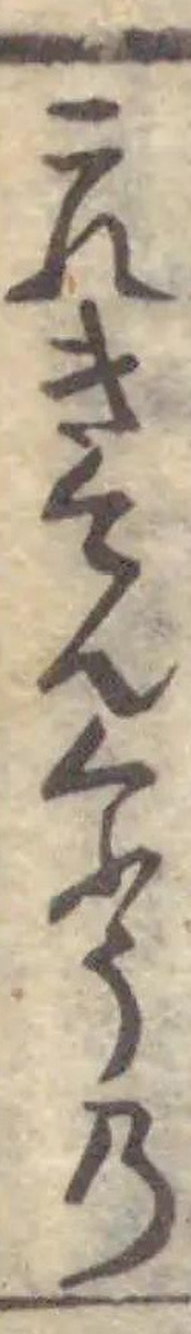これきてんくふうの

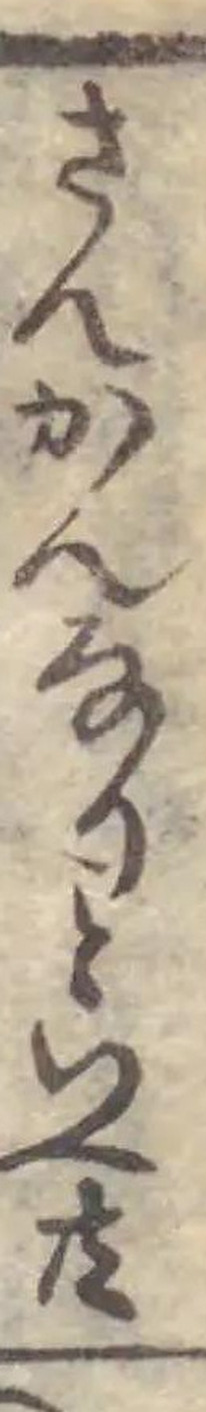さんかんなりといへ共
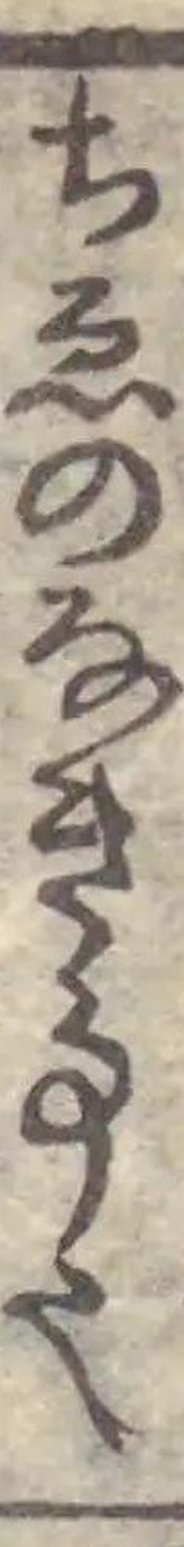ちゑのなき事也
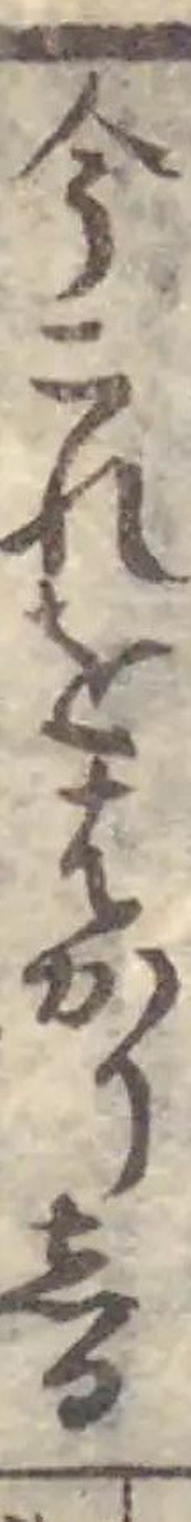今これをはかりしる
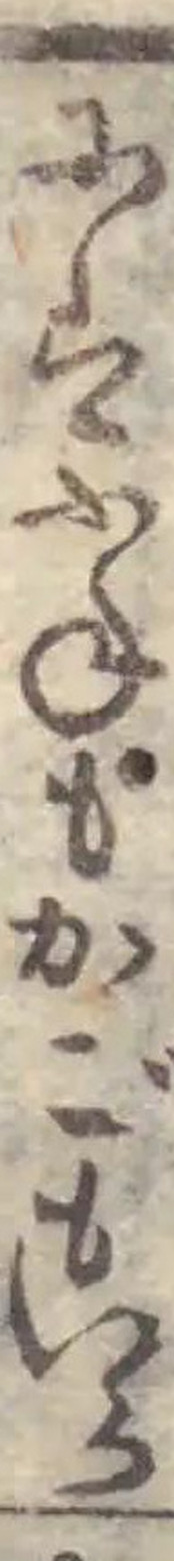にはふねもかごもいら
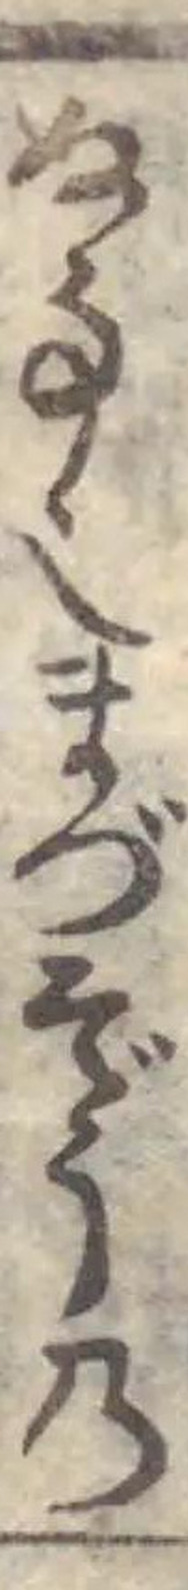ぬ事也まづぞうの
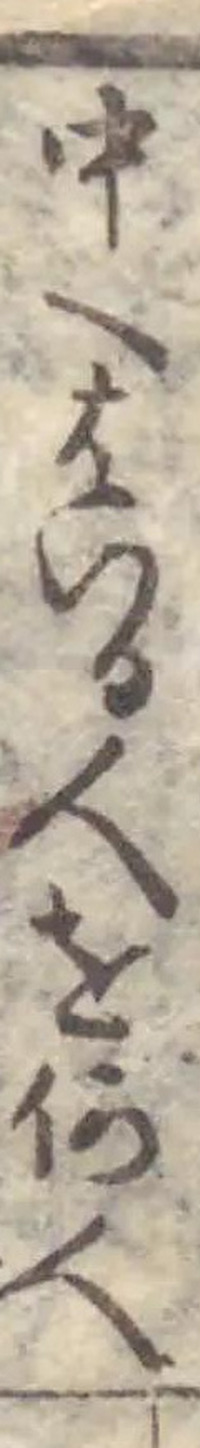中へはいる人を何人
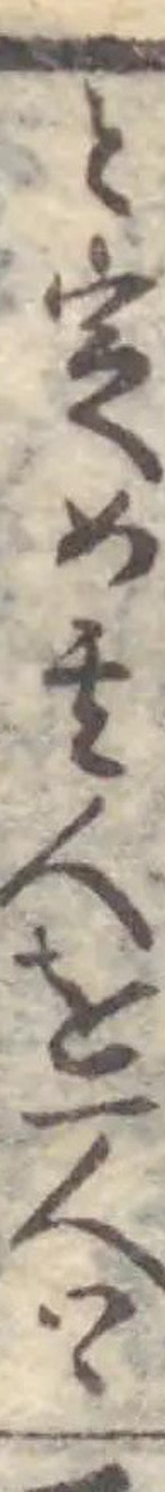と定め其人を一人つゝ
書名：大通人好記
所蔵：国立国会図書館 National Diet Library, JAPAN
